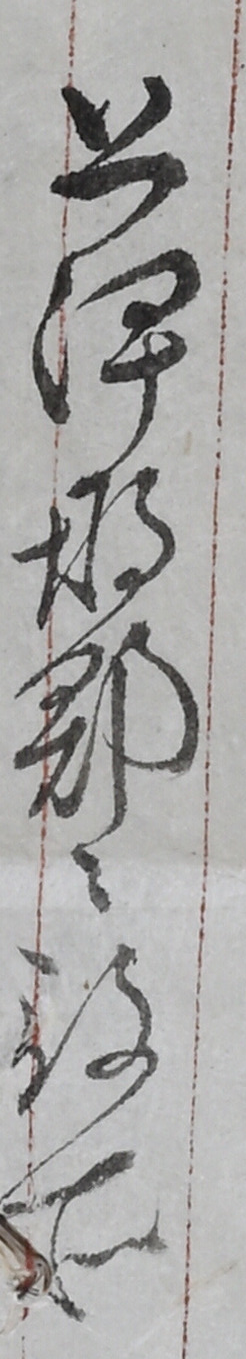上伊那郡々役所
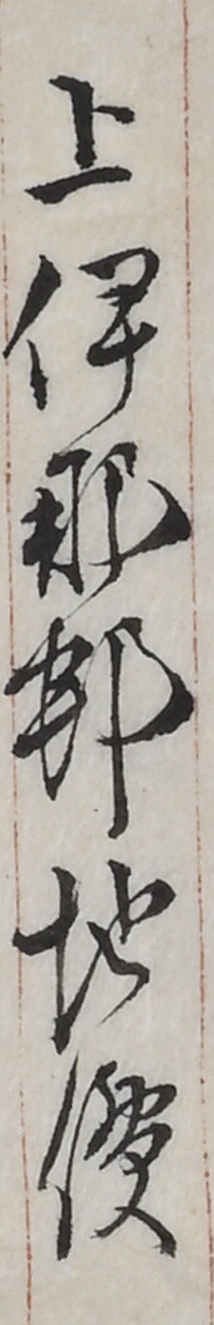上伊那郡地価
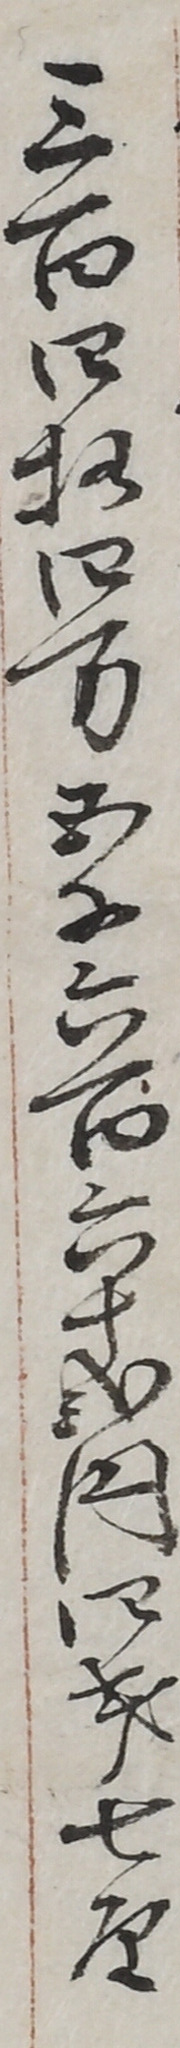三百四拾四万五千六百六十弐円四銭七厘
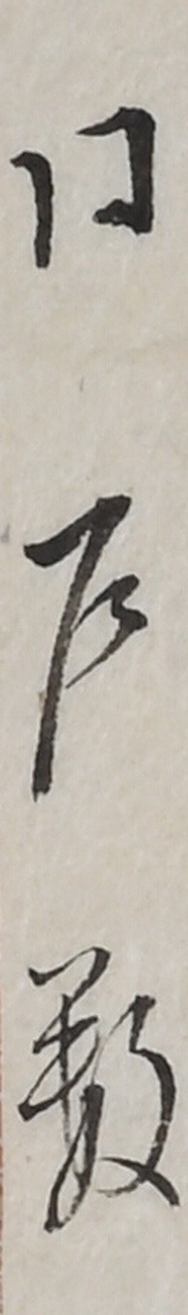同戸数
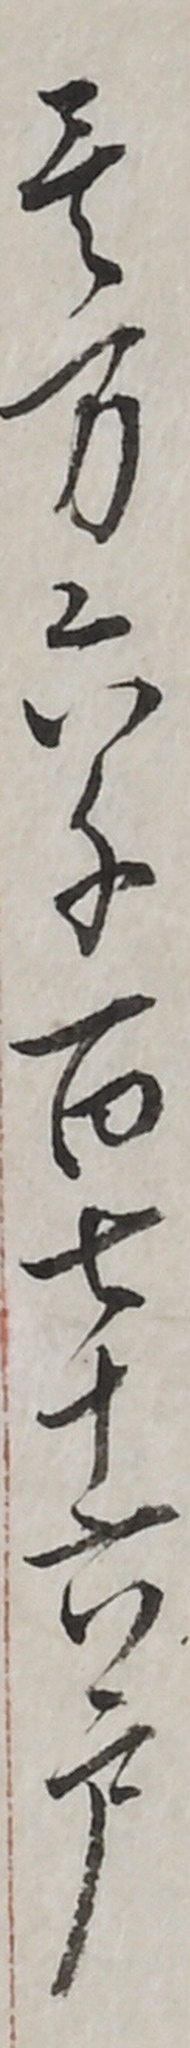壱万六千百七十六戸
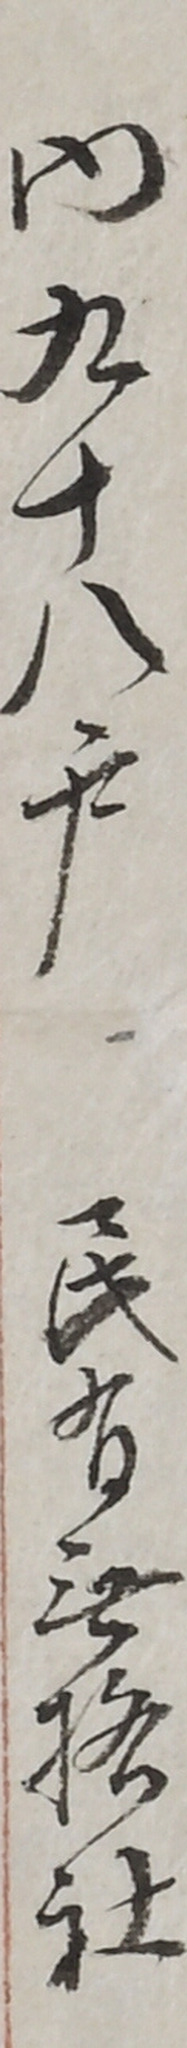内九十八戸民有無格社
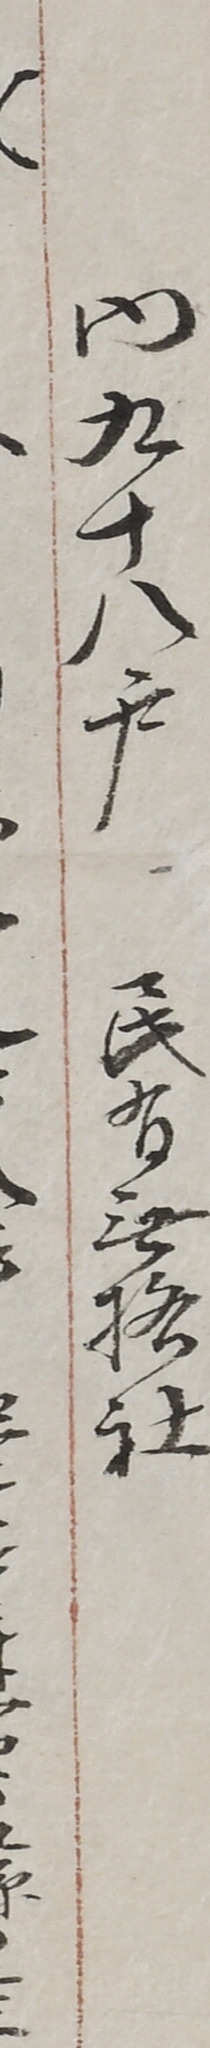内九十八戸民有無格社
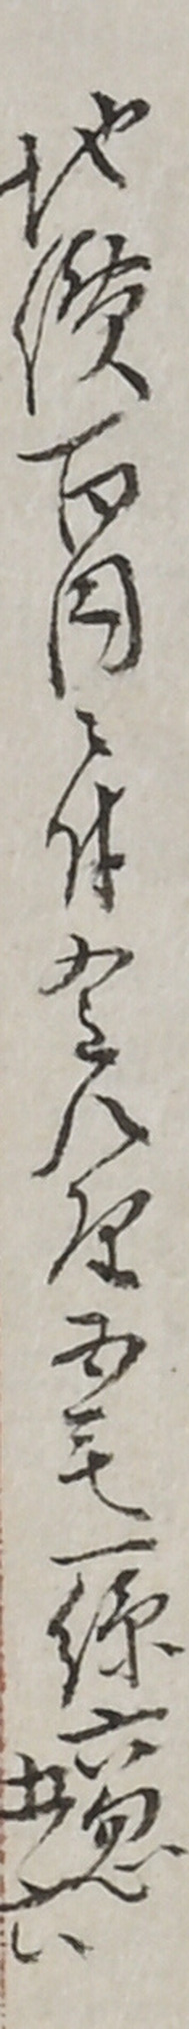地価百円ニ付金八厘五毛一條六忽五六
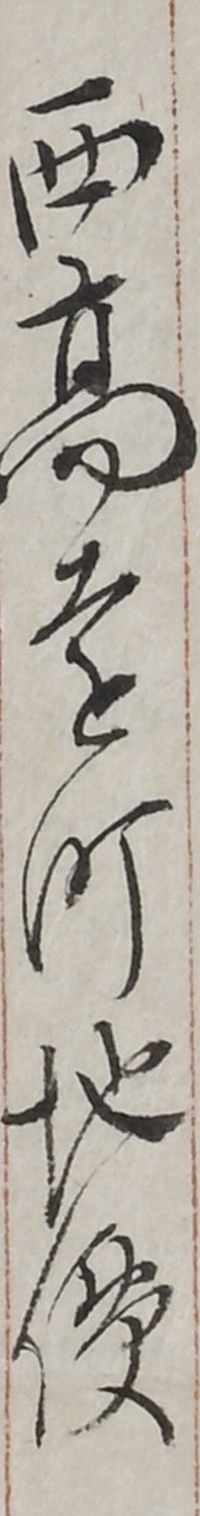西高遠河地価
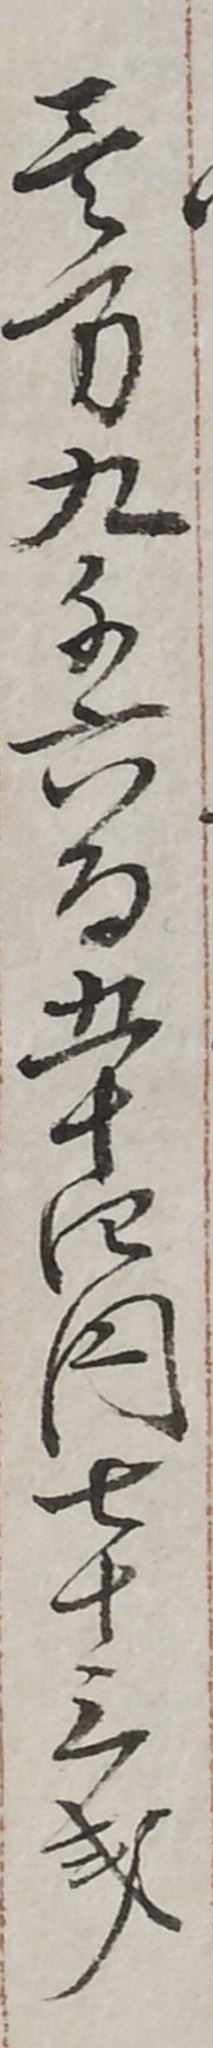壱万九千六百五十四円七十三銭
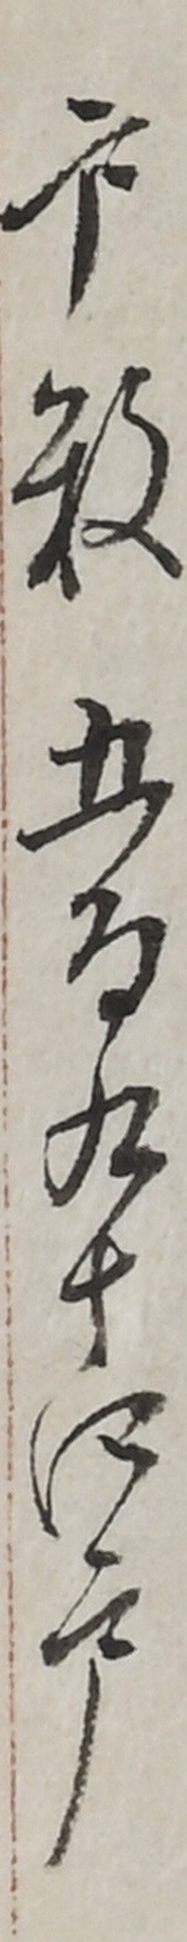戸数五百九十四戸

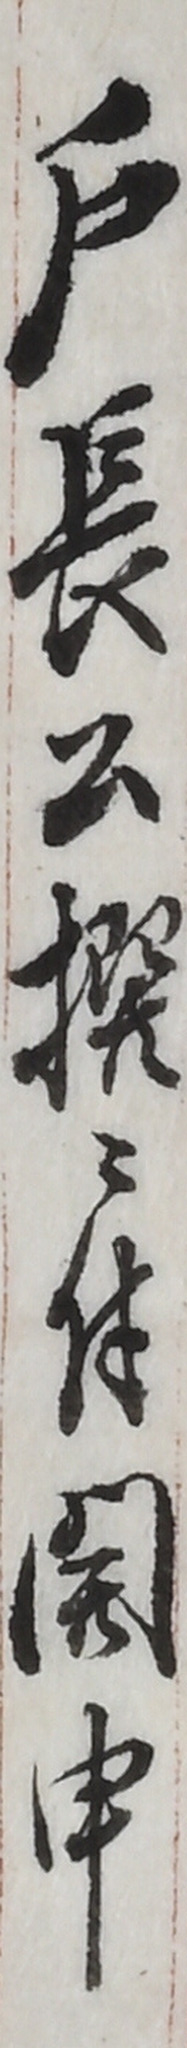戸長公撰ニ付開申
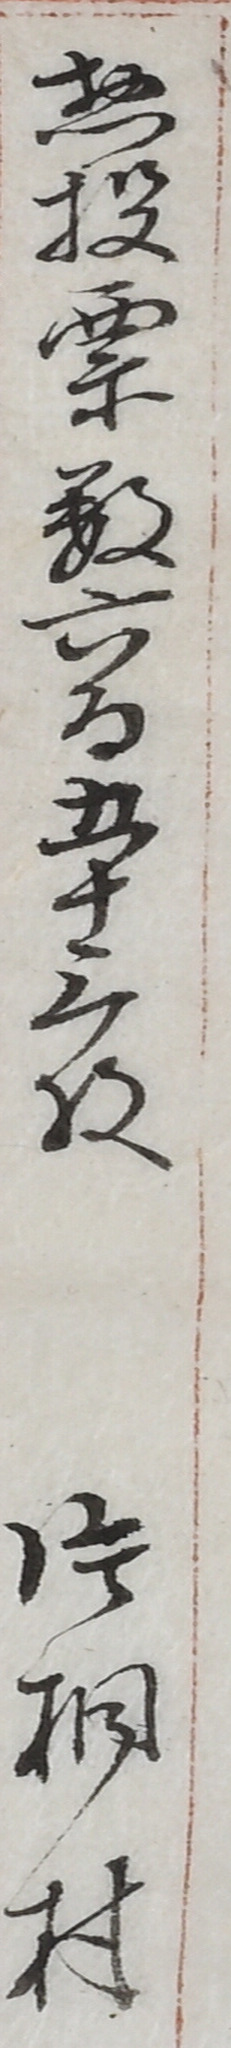惣投栗数六百五十三枚片桐村
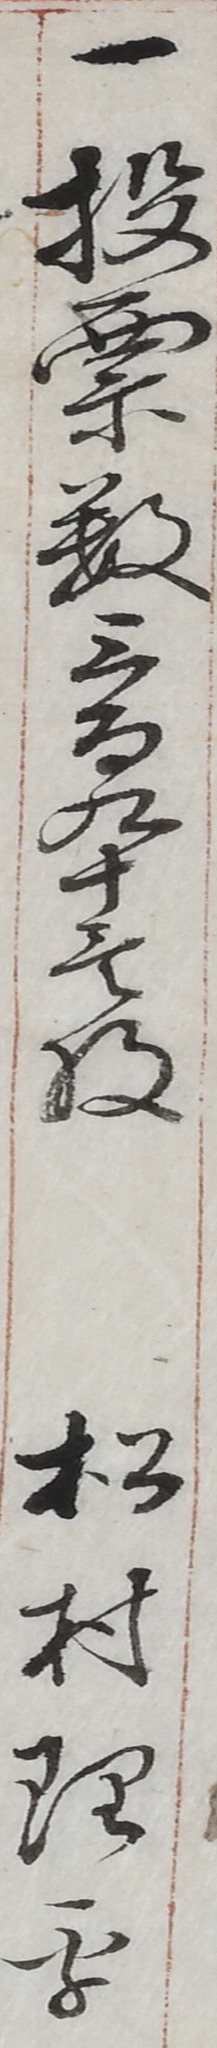一投栗数三百九十壱枚松村理平
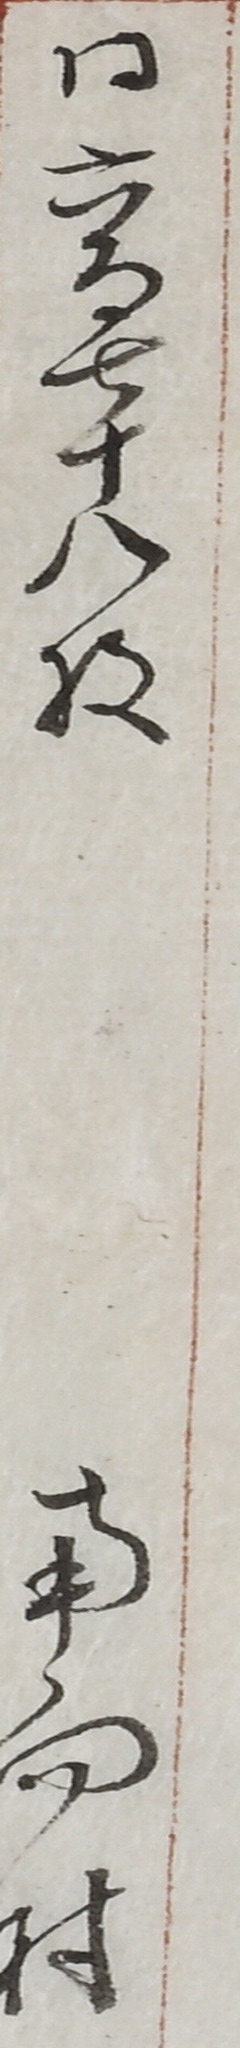同六百七十八枚南向村
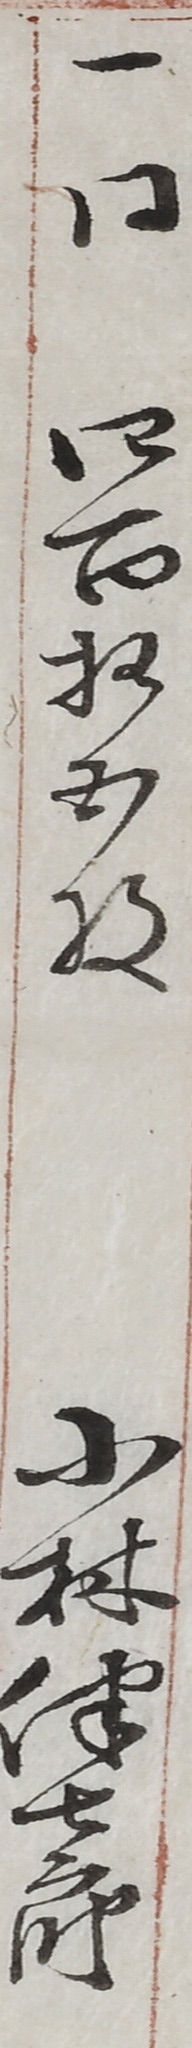一同四百拾五枚小林伴七郎
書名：郡役所勤務中御用抜書
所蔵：伊那市立高遠町図書館・合同会社AMANE
